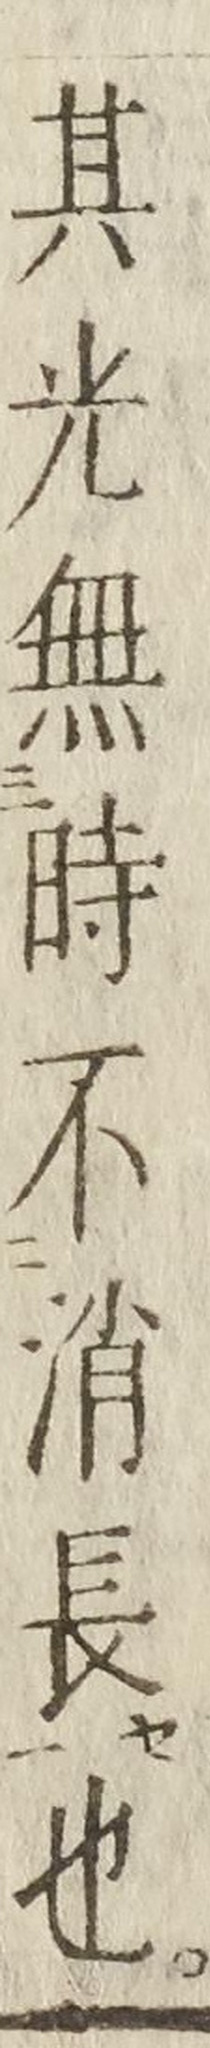其光無時不消長也。
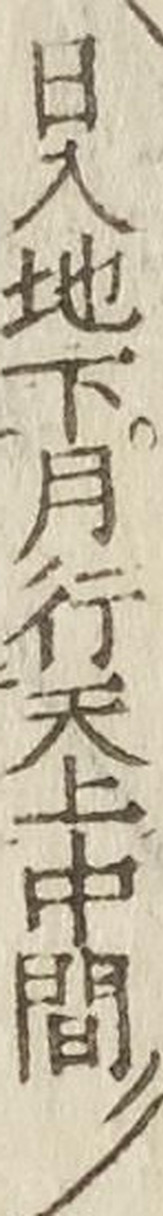日入地下。月行天上。中間
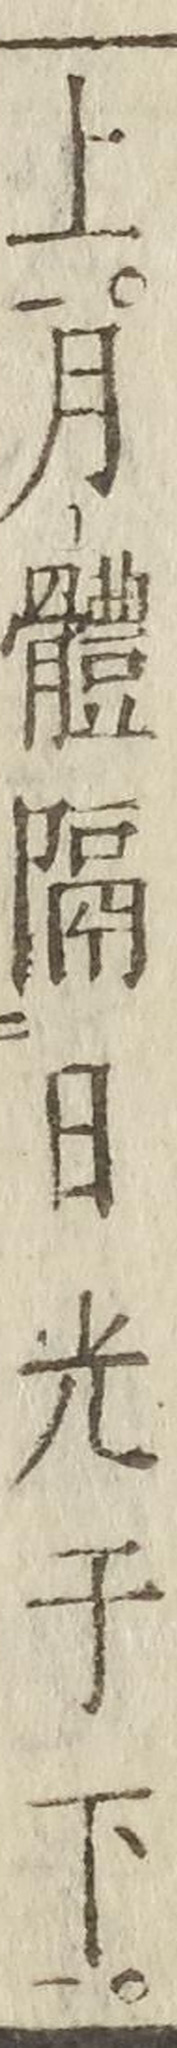上。月ー体隔日光于下。
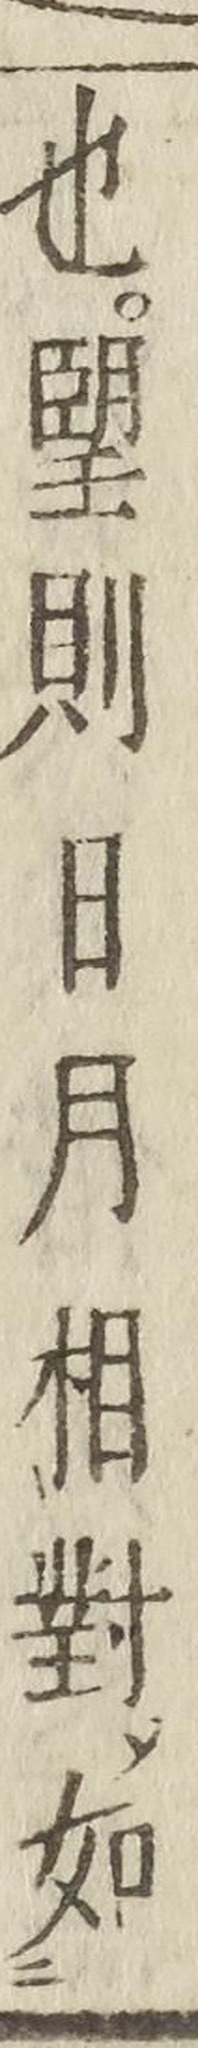也。望則日月相対如
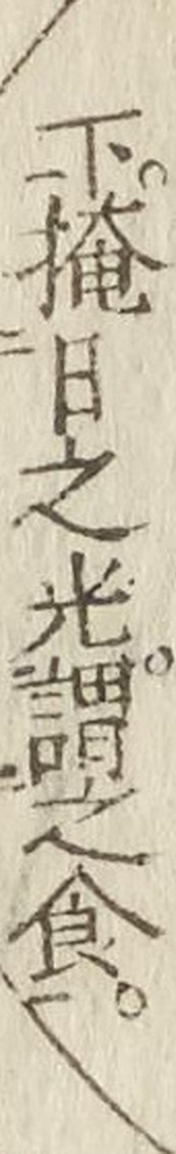下。掩日之光。謂之食。
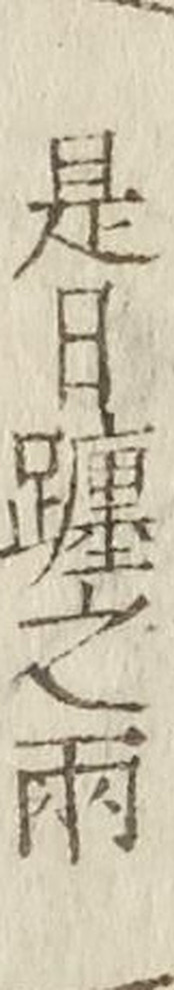是日躔之雨
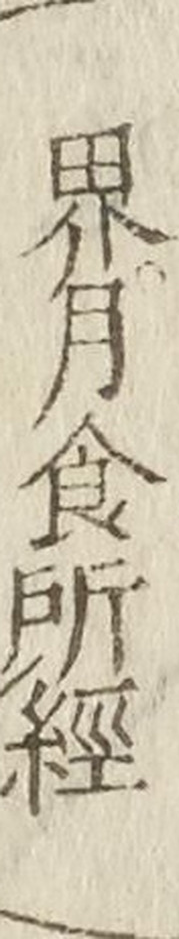界。月食所経
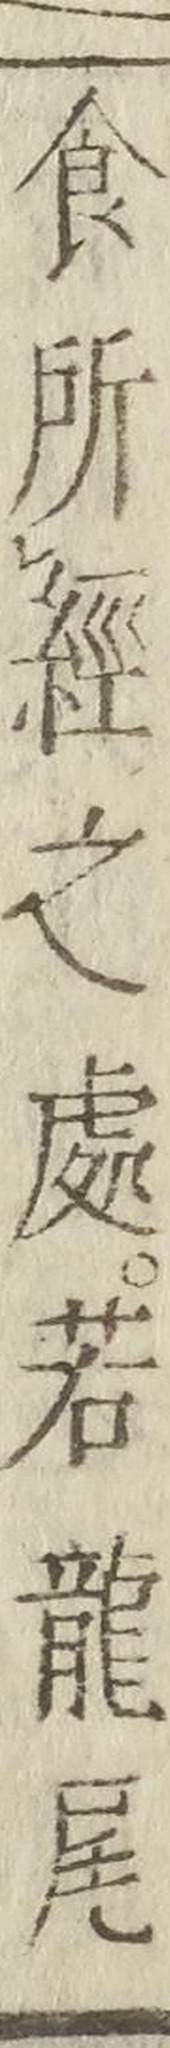食所経之処。若竜尾
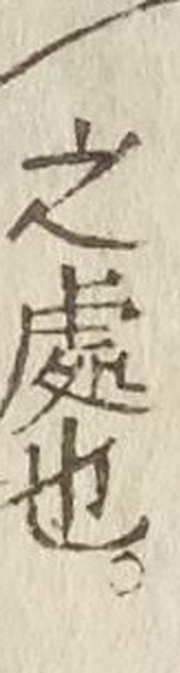之処也。

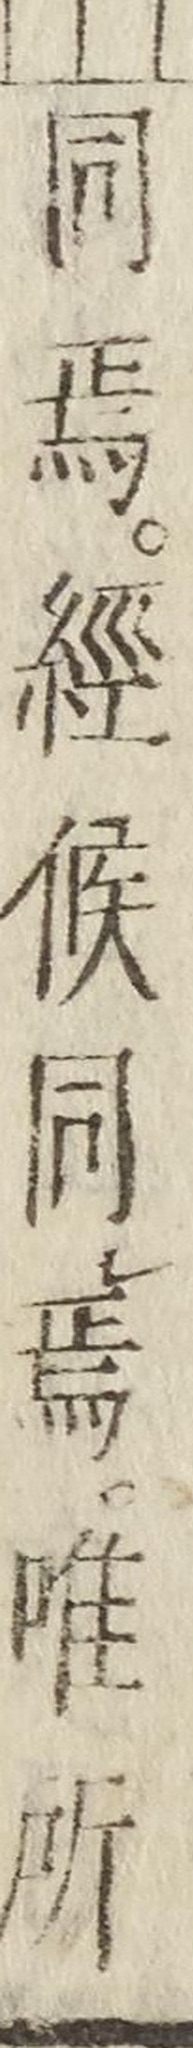同焉。経候同焉。唯所
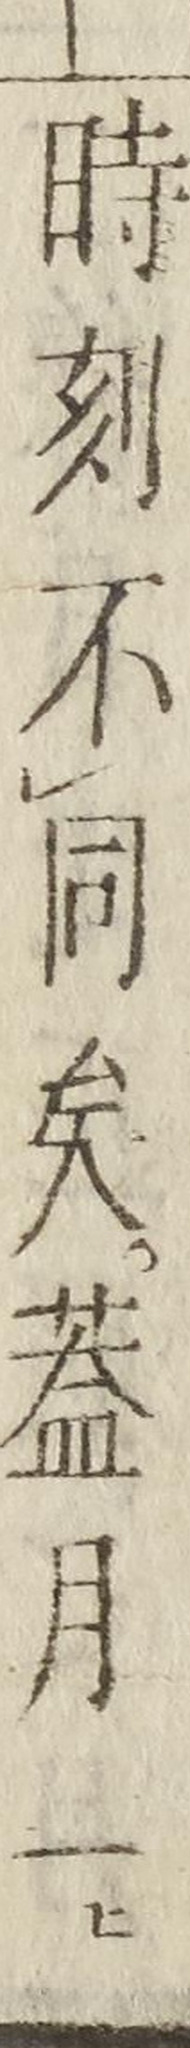時刻不同矣。蓋月一
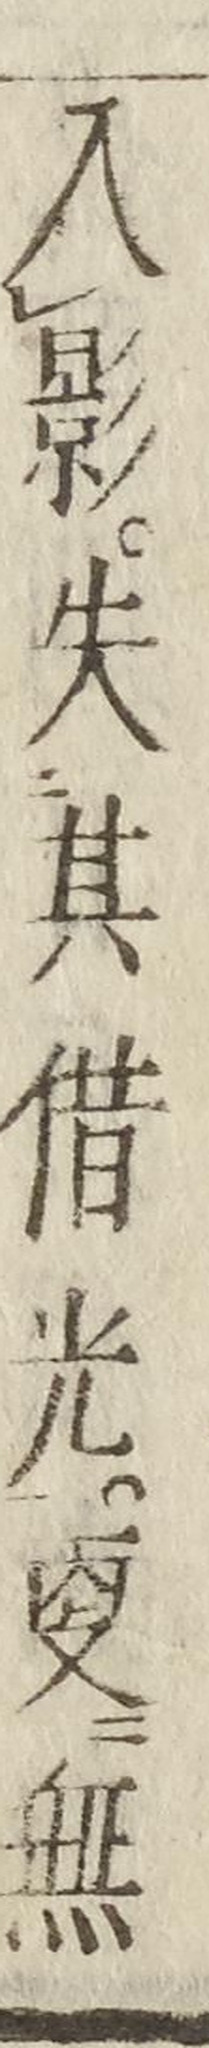入影。失其借光。更無
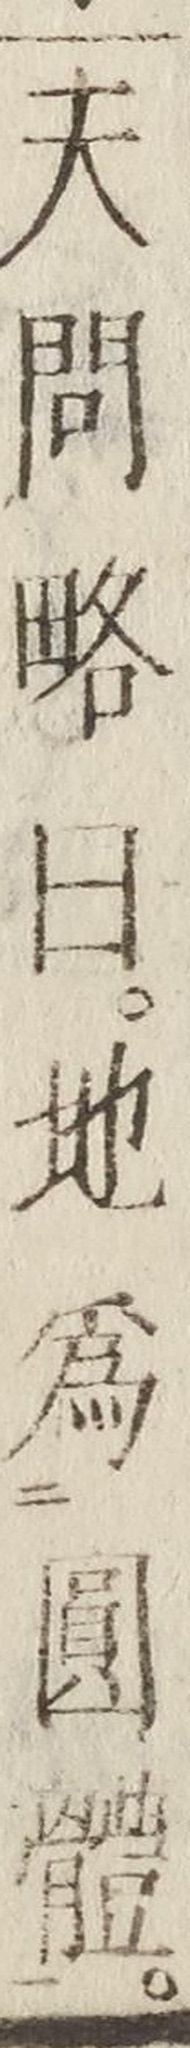天問略曰。地為円体。
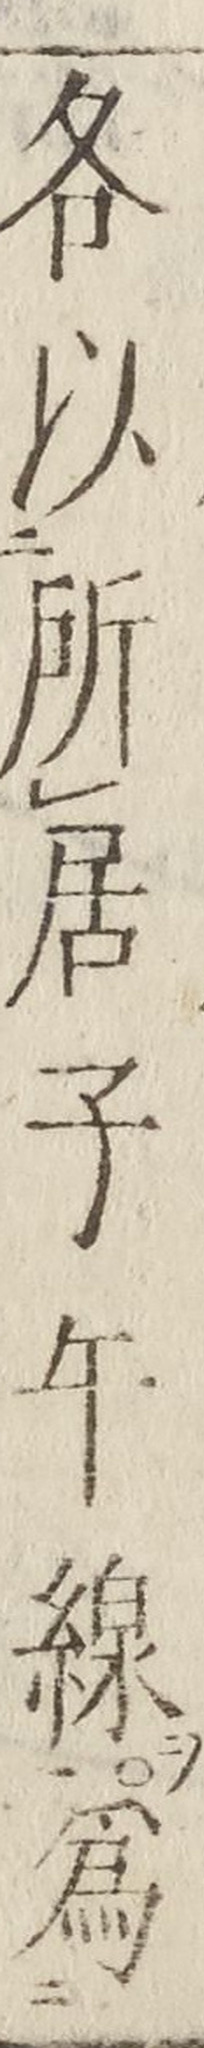各以所居子午線。為
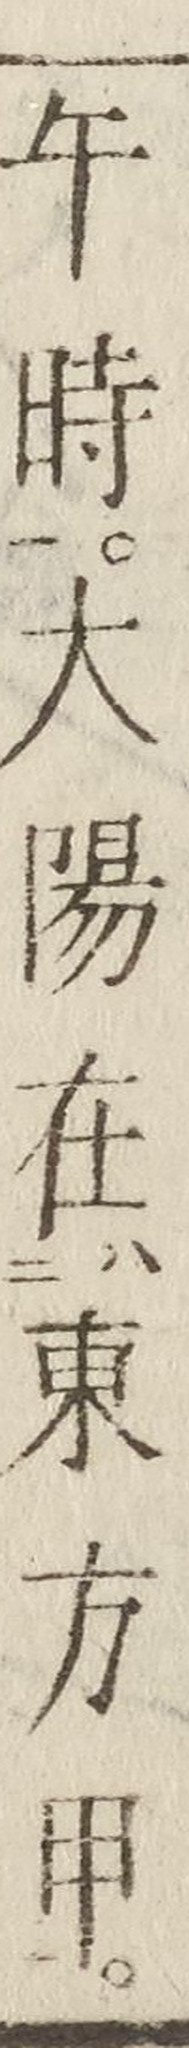午時。大陽在東方甲。
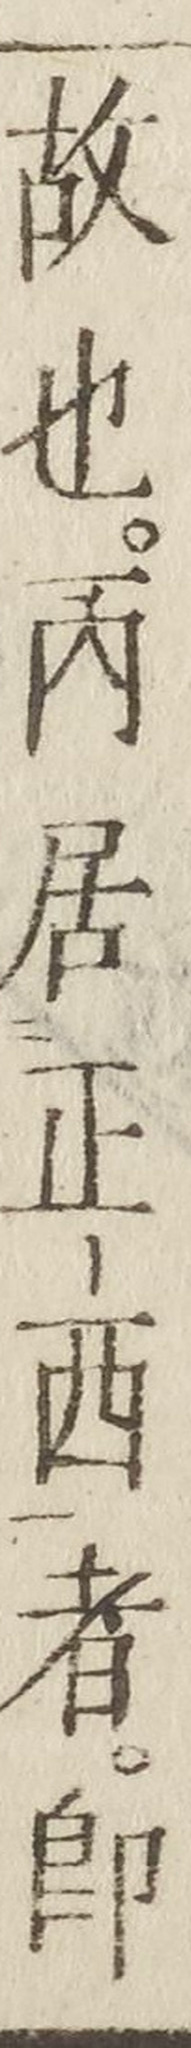故也。丙居正ー西者。即
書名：天經或問　序圖
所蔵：東京大学地震研究所図書室 Earthquake Research Institute Library, The University of Tokyo, JAPAN
